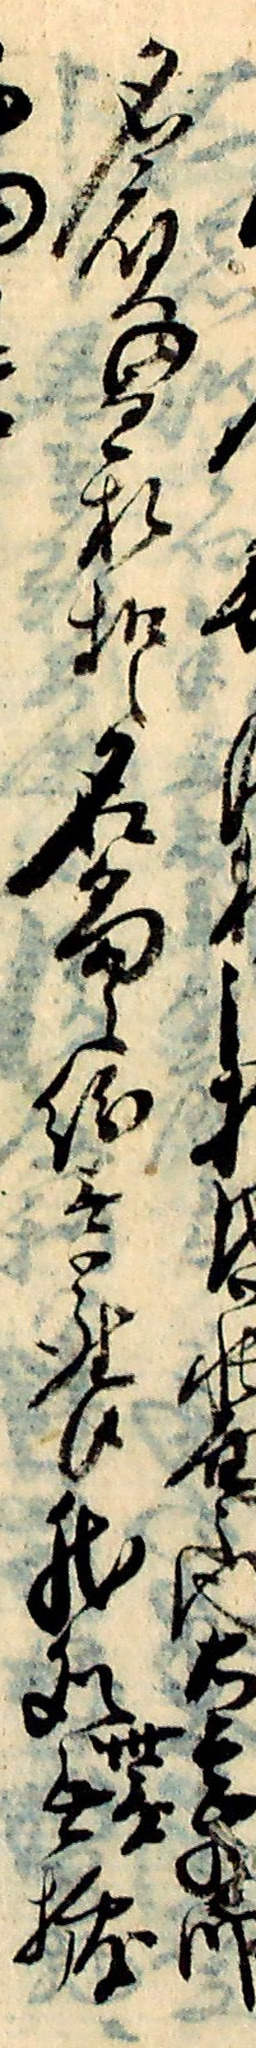名負にて私扣之名畠に紛無御座候然処此度無拠
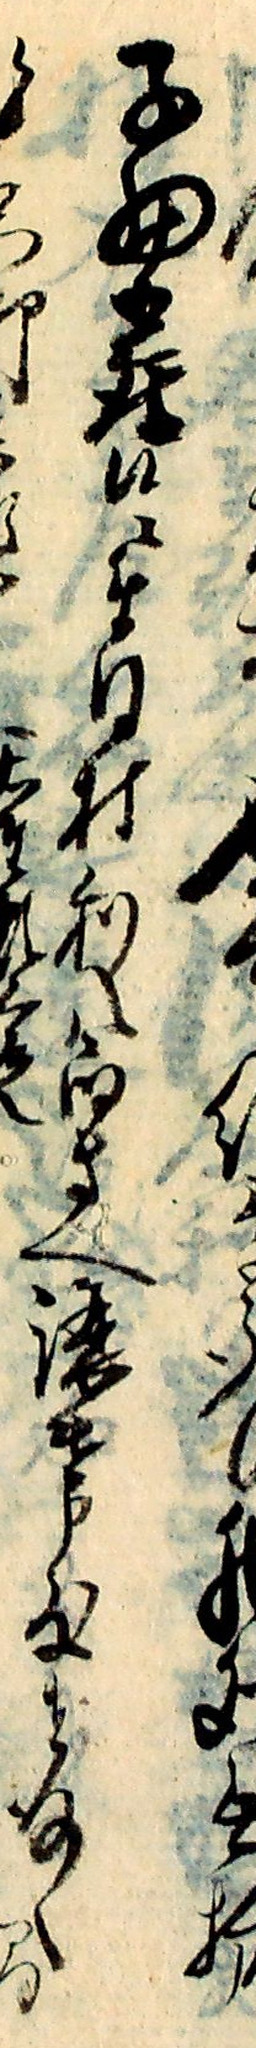子細御座候に付同村利八郎方へ譲遣申度奉存候間
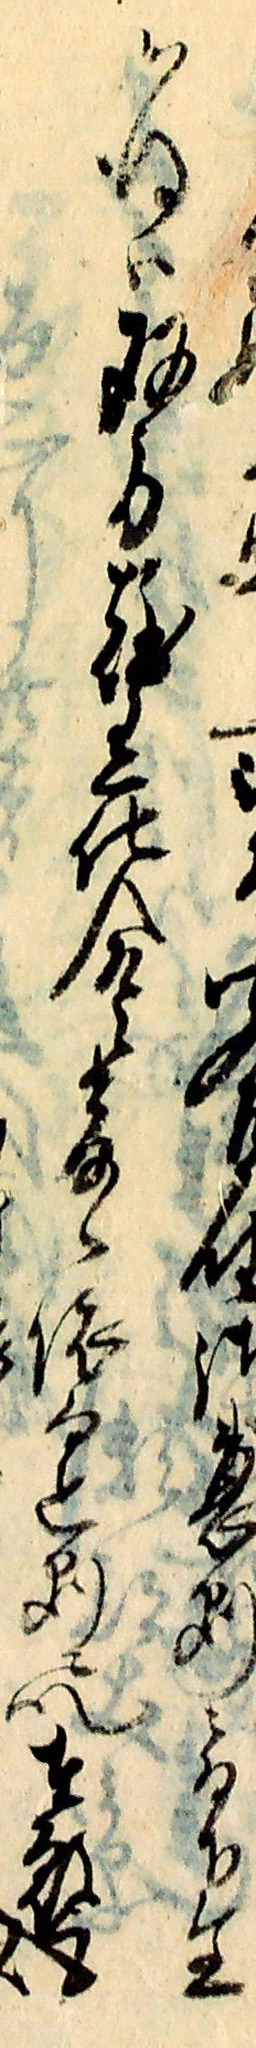候得は双方難有仕合に奉存候依て連判を以奉願上候
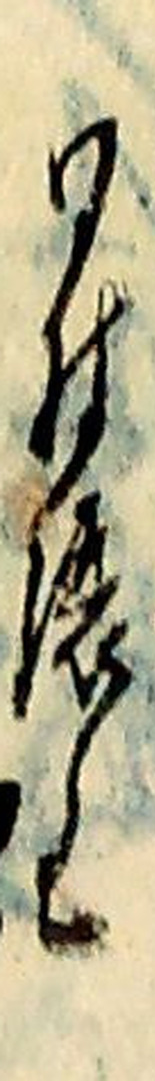同村譲主
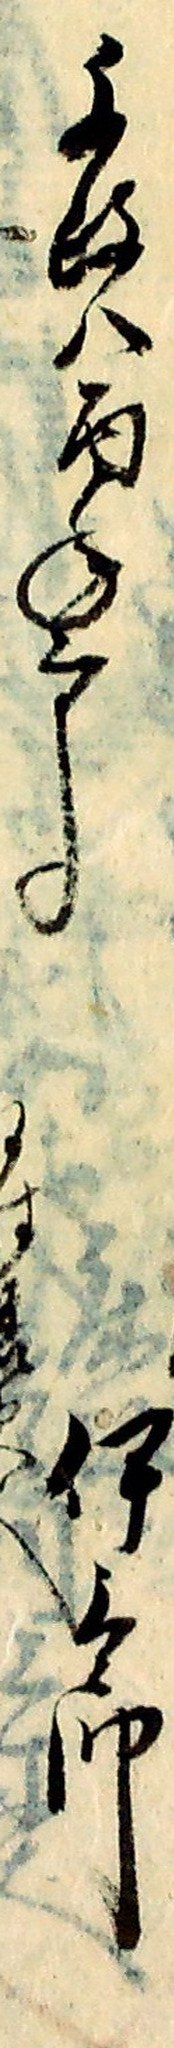文政八酉年二月伊三郎
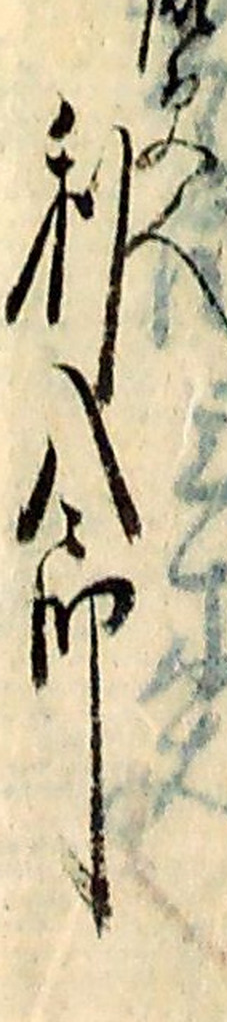利八郎
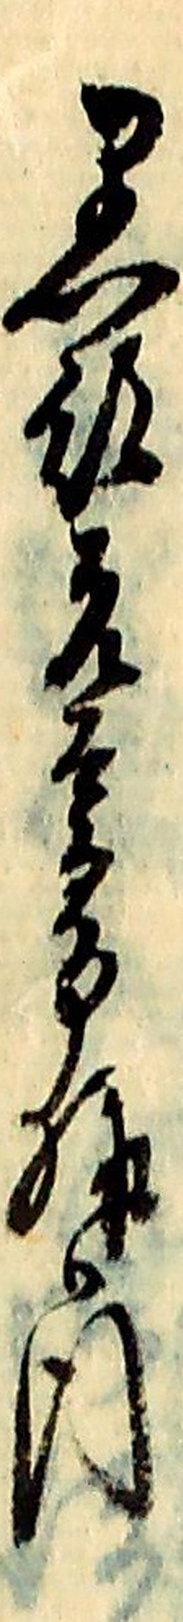黒部吉太郎様御内
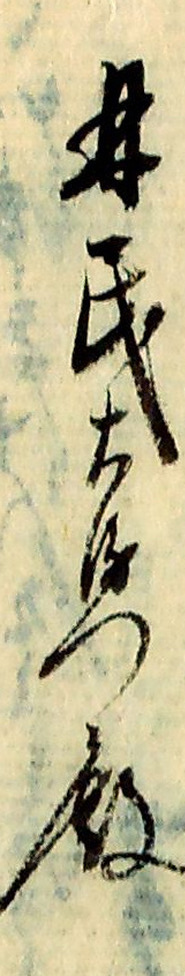林武右衛門殿
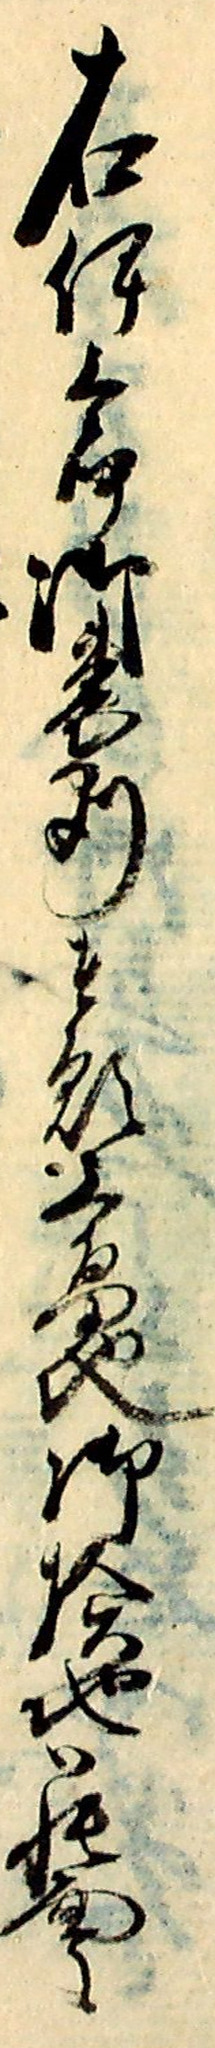右伊三郎御裏判奉願上畠地御検地御帳面に
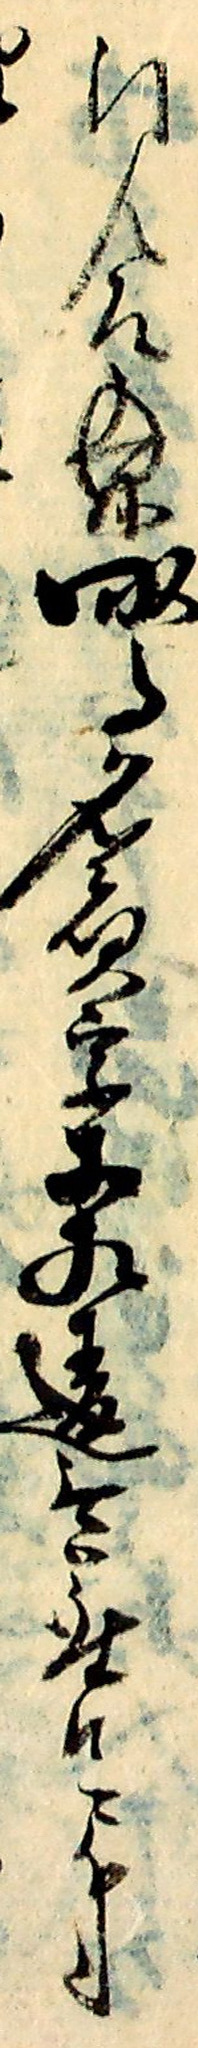引合畝高名負字等相違無御座候に付
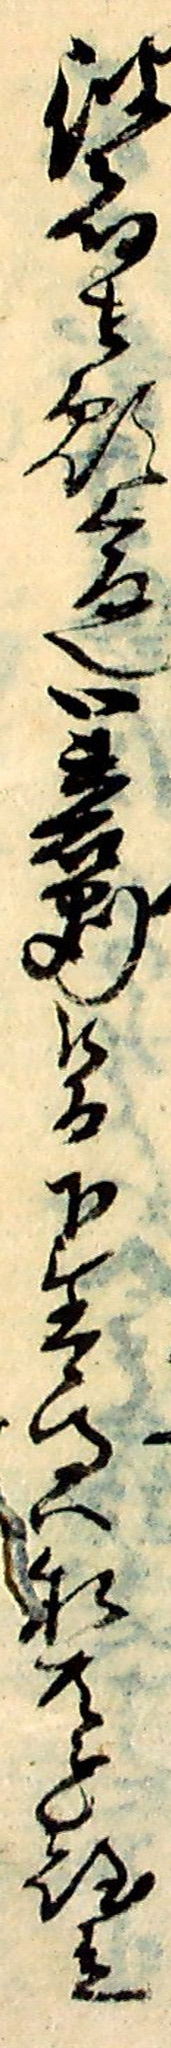彼者奉願上通御裏判被為下置候得は私共迄難有
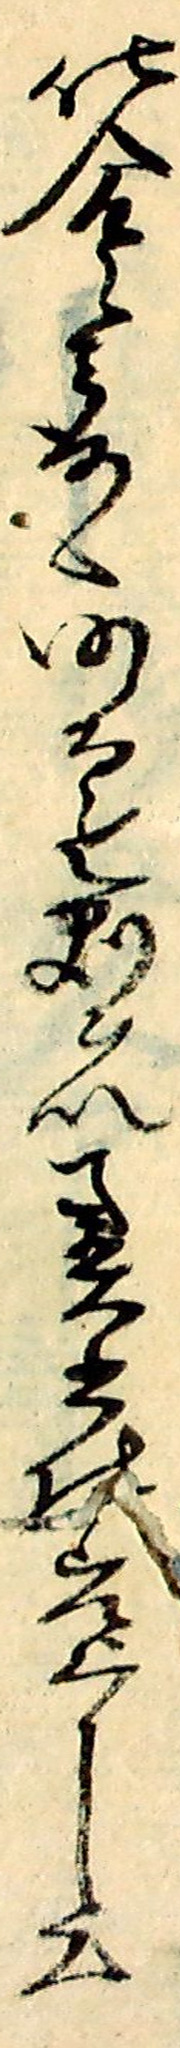仕合に奉存候仍て連判を以奥書仕差上申候以上
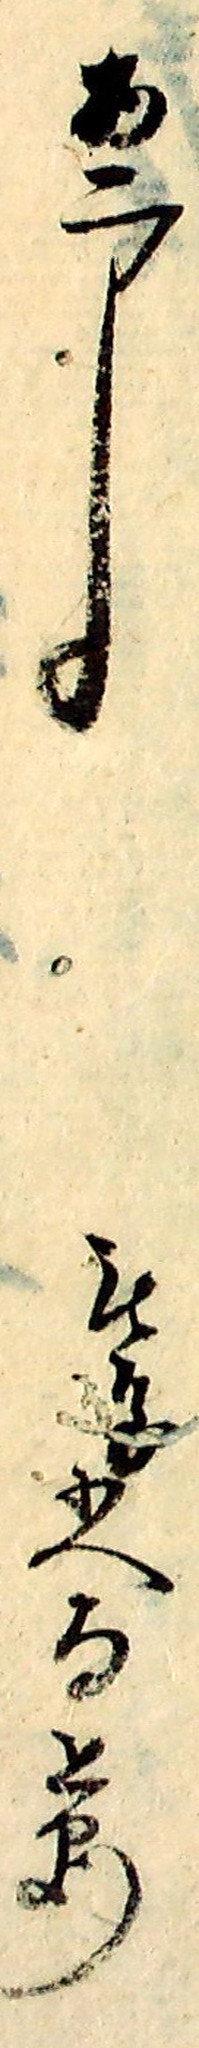酉二月庄屋五人与連判
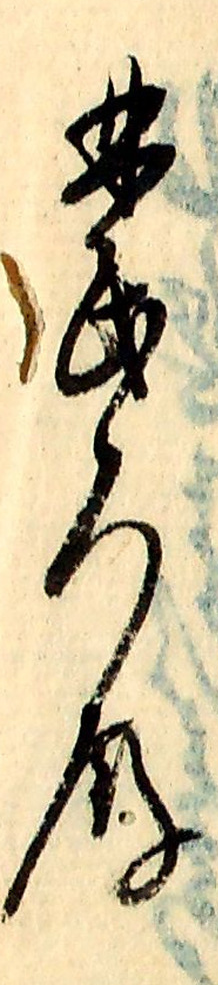林武右衛門殿

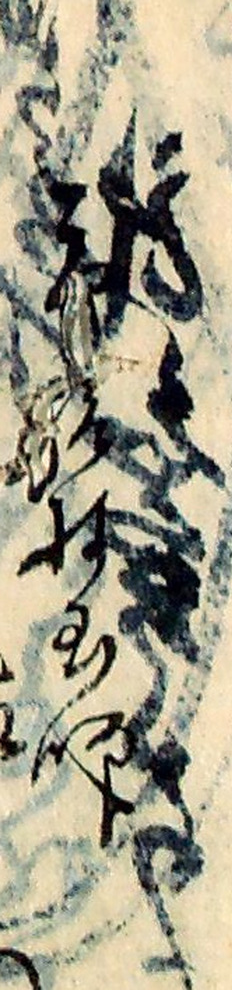第拾村玉師
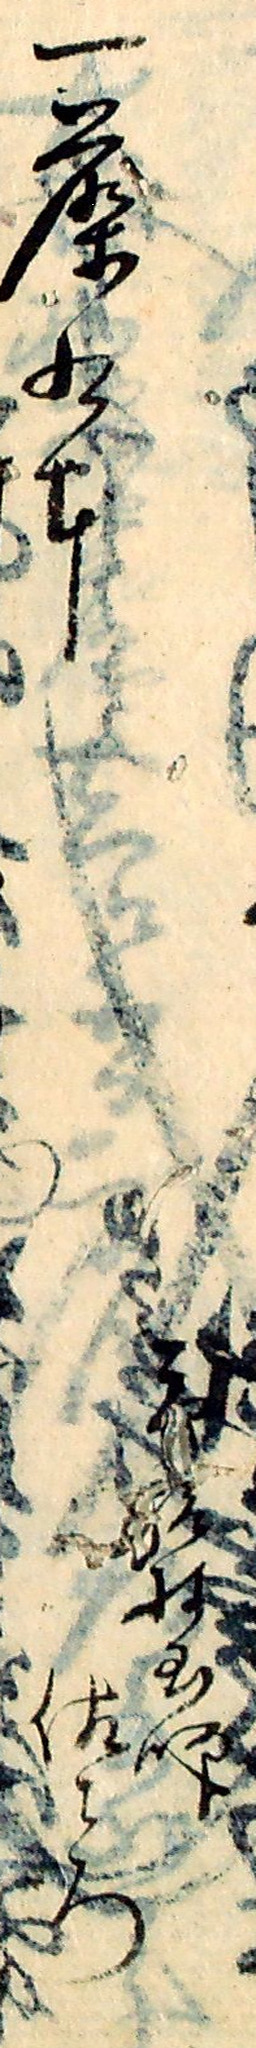一蒅九本佐右衛門
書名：諸御願書控(後藤氏壱番）
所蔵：鳴門教育大学 Naruto University of Education
